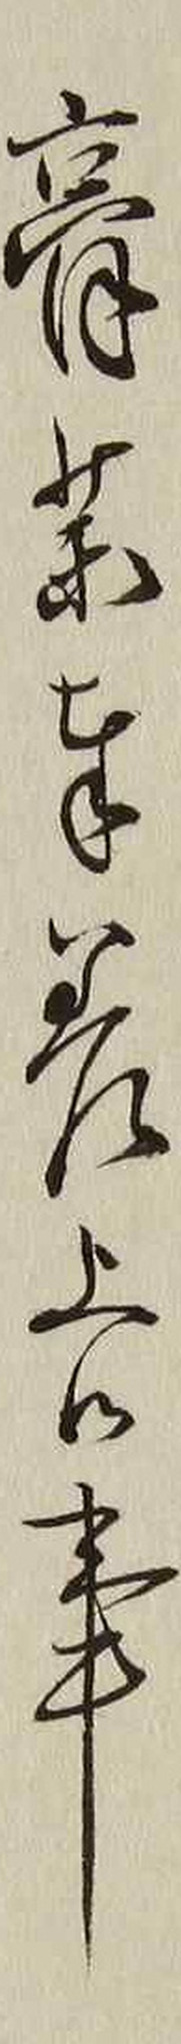膏薬奉差上候事
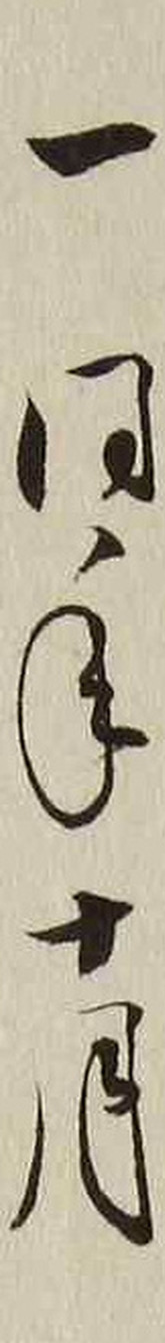一同年十月
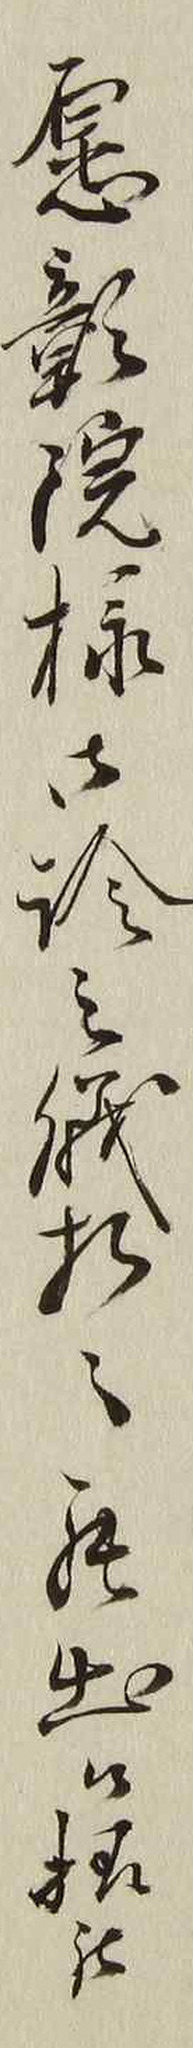愿彰院様御診之儀折々罷出候様被
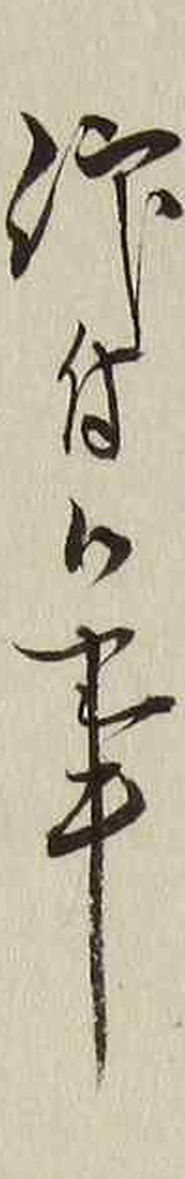仰付候事
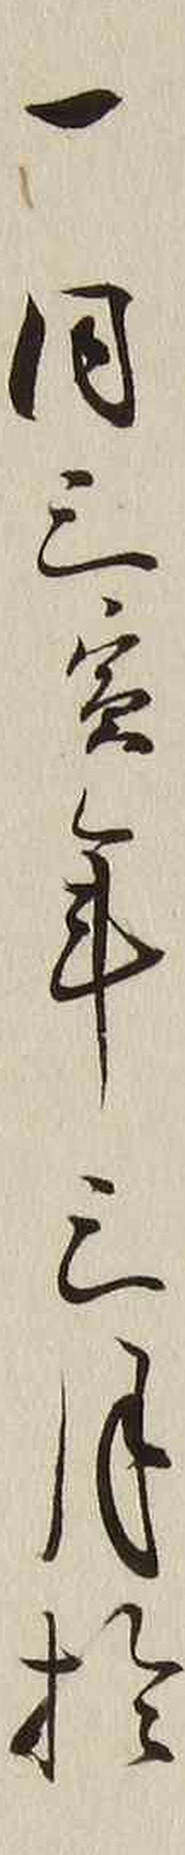一同三寅年三月於
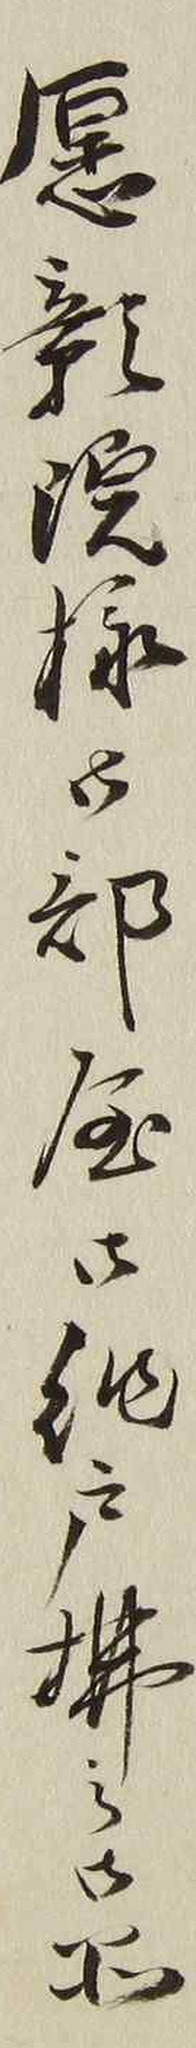愿彰院様御部屋御納戸払之御品
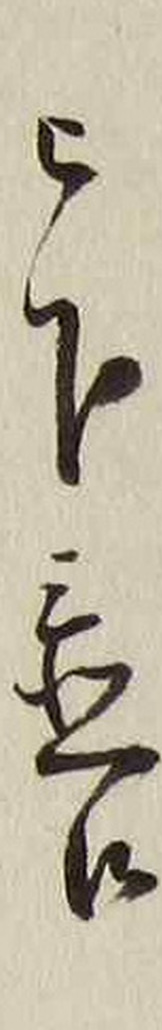被下置候
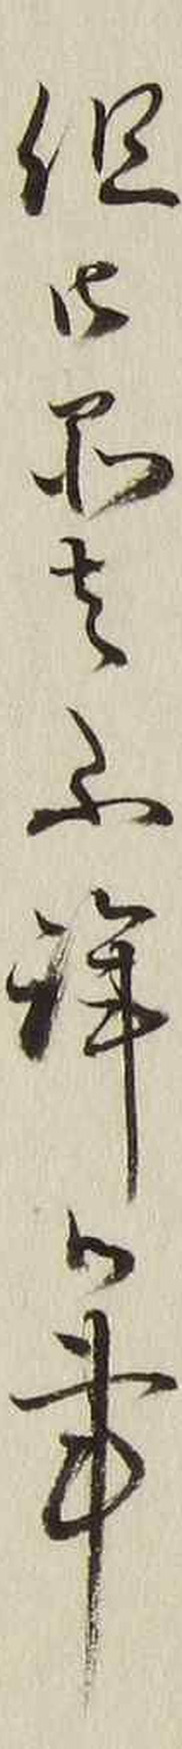但御品は不詳候事
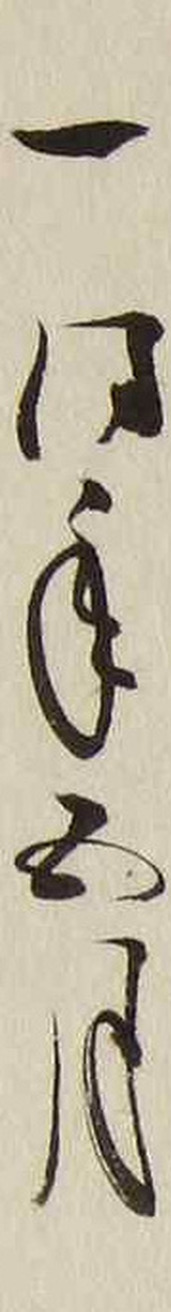一同年五月
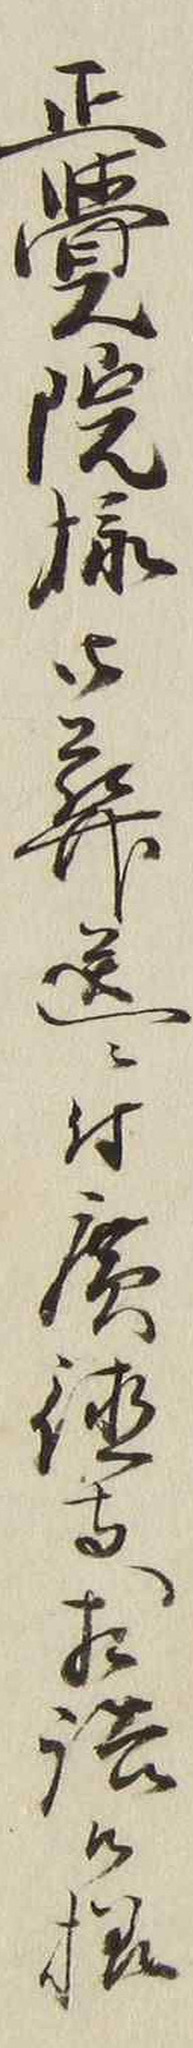正覚院様御葬送に付広徳寺へ相詰候様

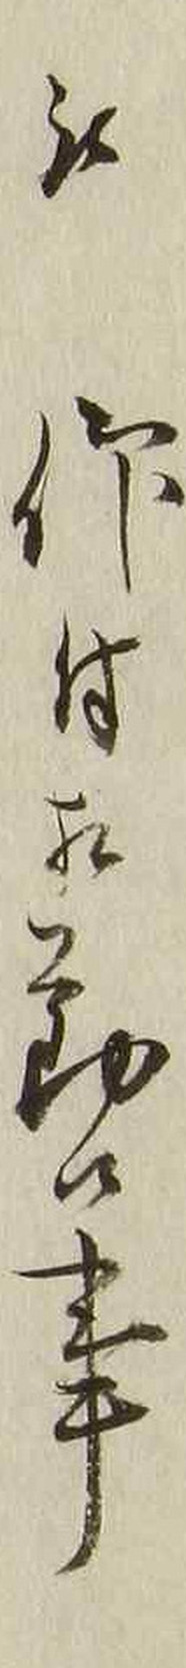被仰付相勤候事
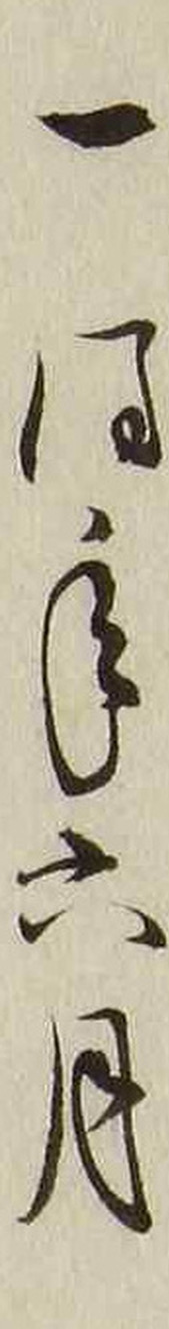一同年六月
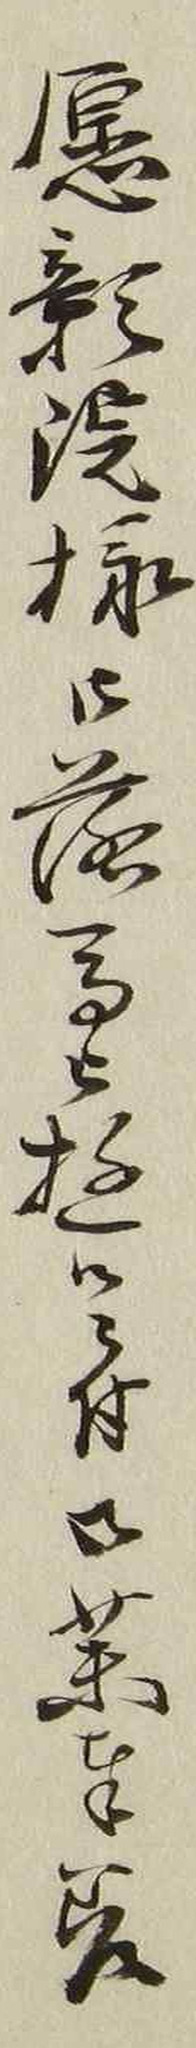愿彰院様御落馬被遊候に付御薬奉差
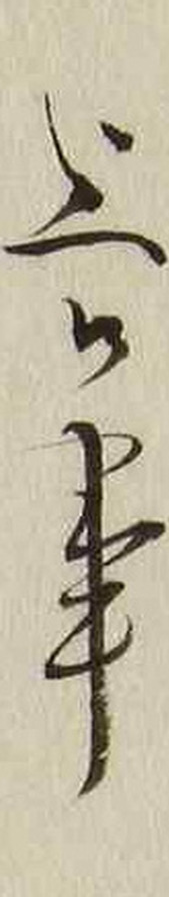上候事
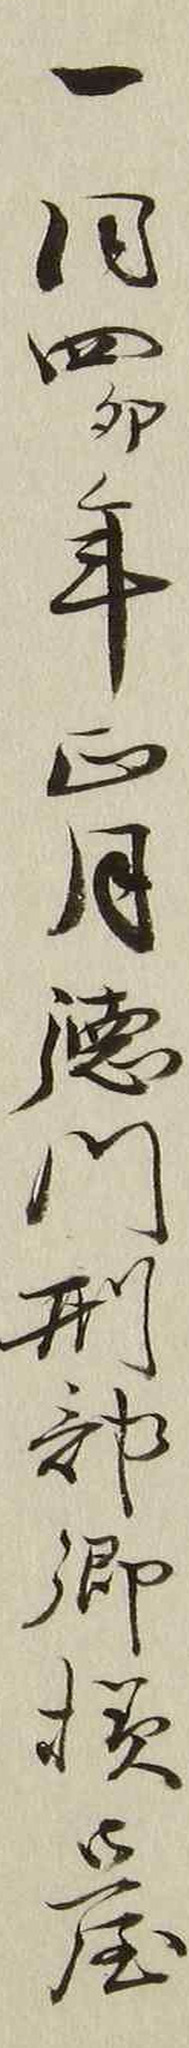一同四卯年正月徳川刑部卿様御屋
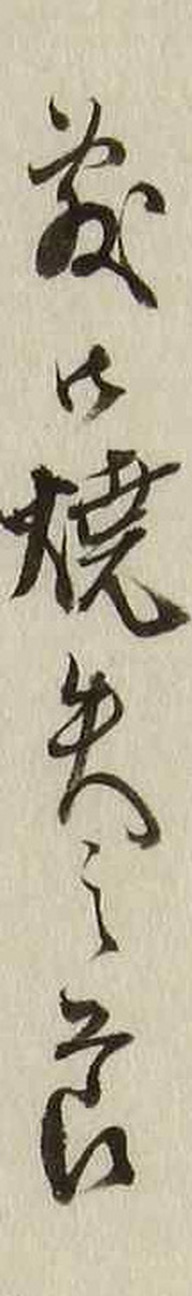敷御焼失之節
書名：諸士系譜　巻之157　ね之部1
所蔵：会津若松市立会津図書館
